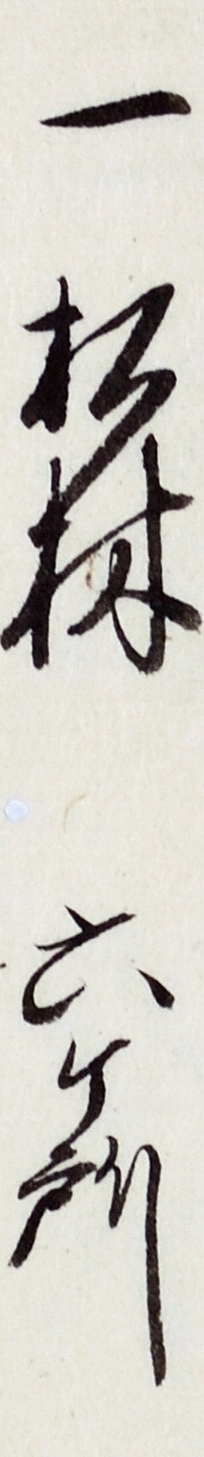一松林六ケ所
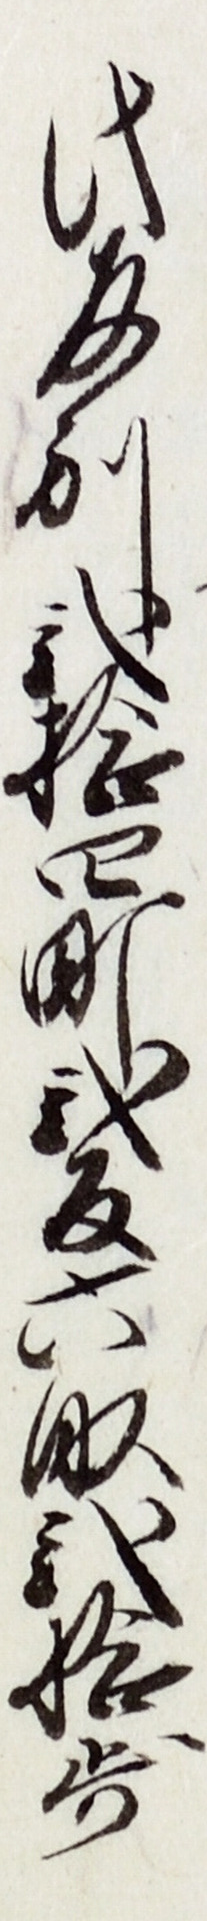此反別弐拾四町弐反六畝弐拾歩
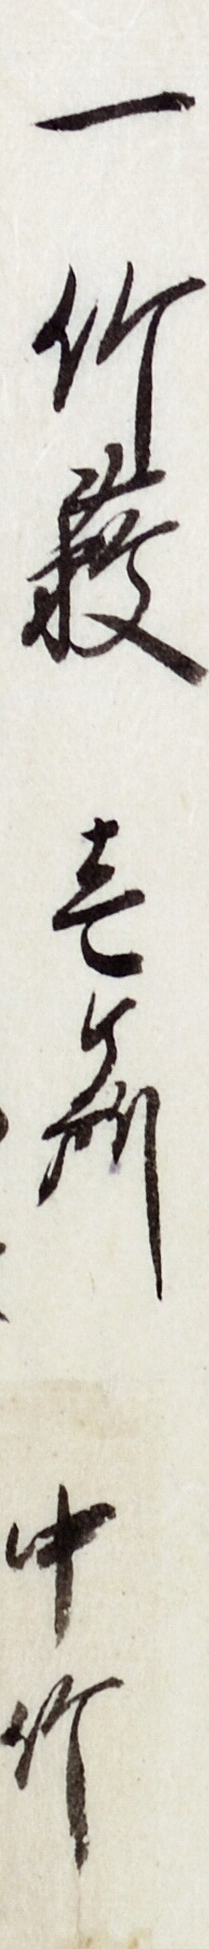一竹藪壱ケ所中竹
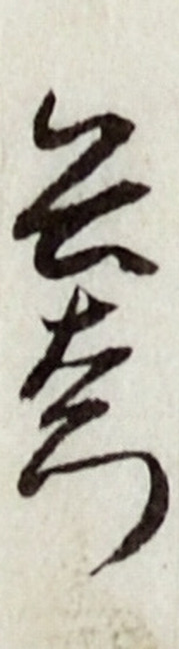政右衛門
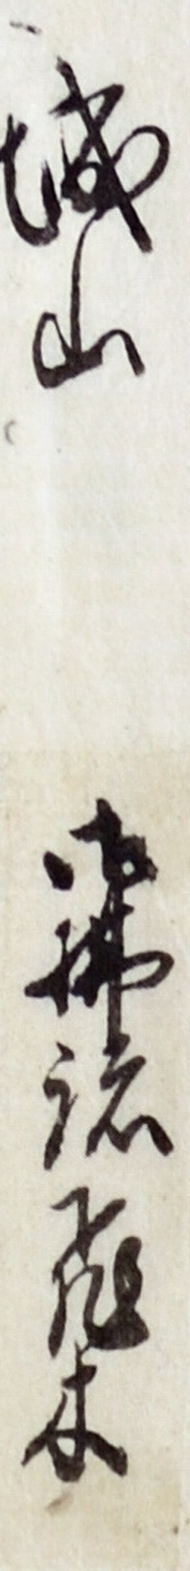城山御払跡飛木

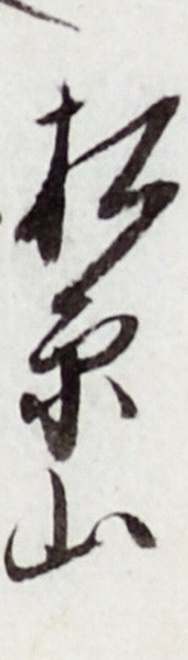松原山
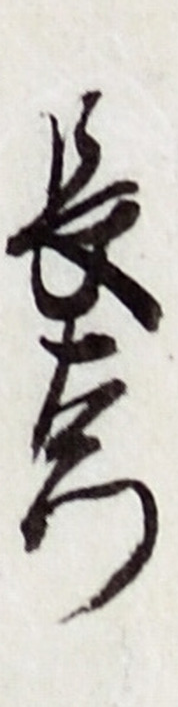幾右衛門
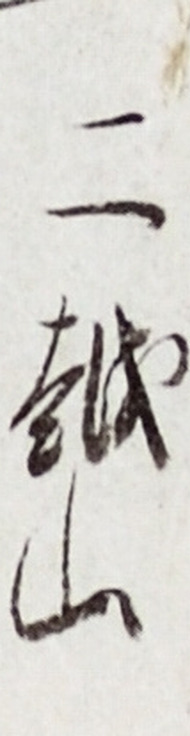二越山
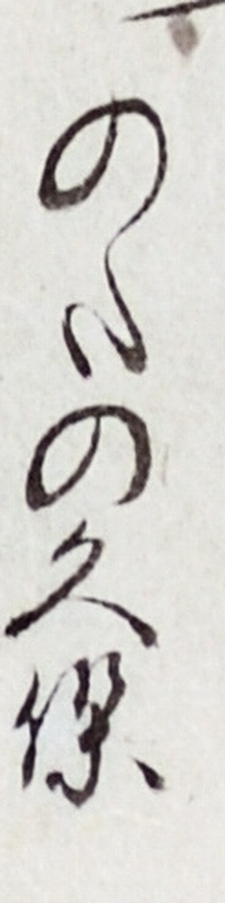のたの久保
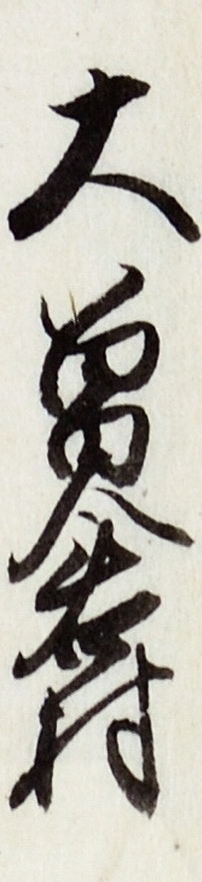大曾倉村
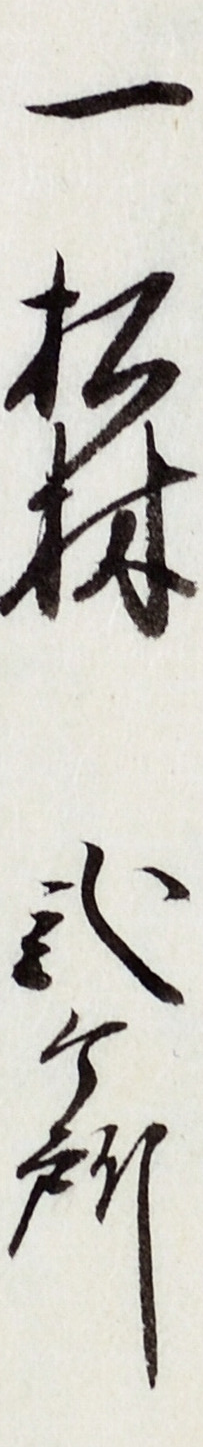一松林弐ケ所
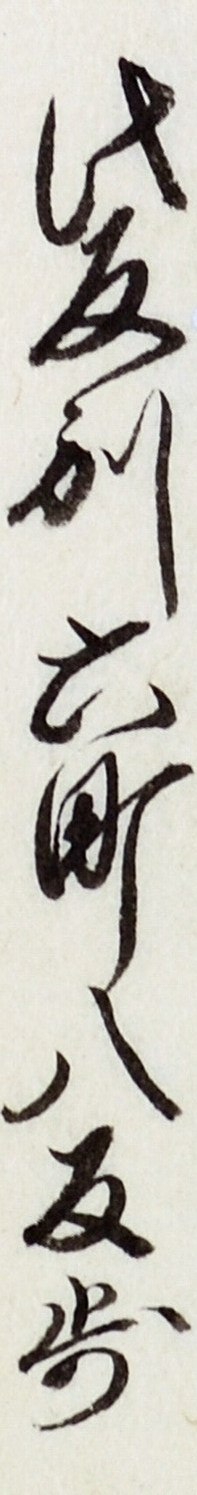此反別六町八反歩
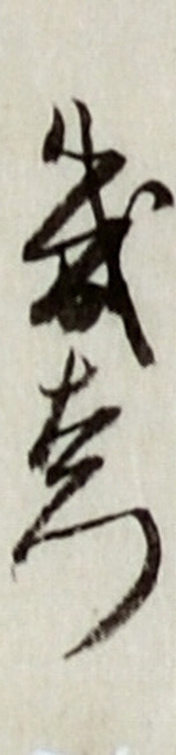幾右衛門

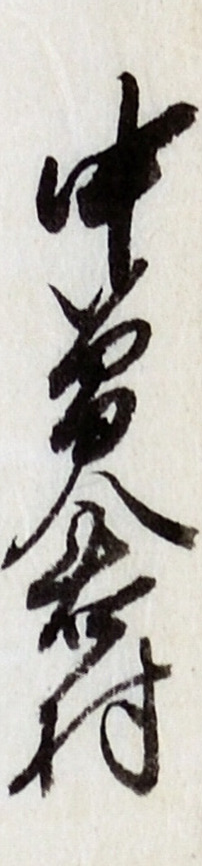中曾倉村
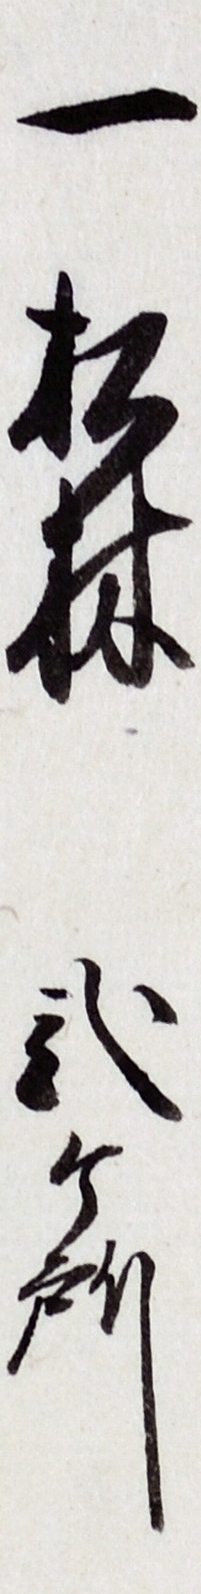一松林弐ケ所
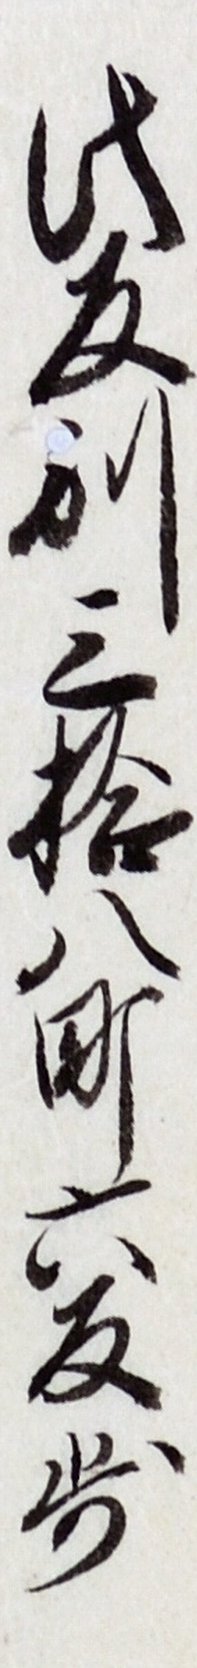此反別三拾八町六反歩
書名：御領分中御林御藪附帳
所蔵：伊那市立高遠町図書館・合同会社AMANE
